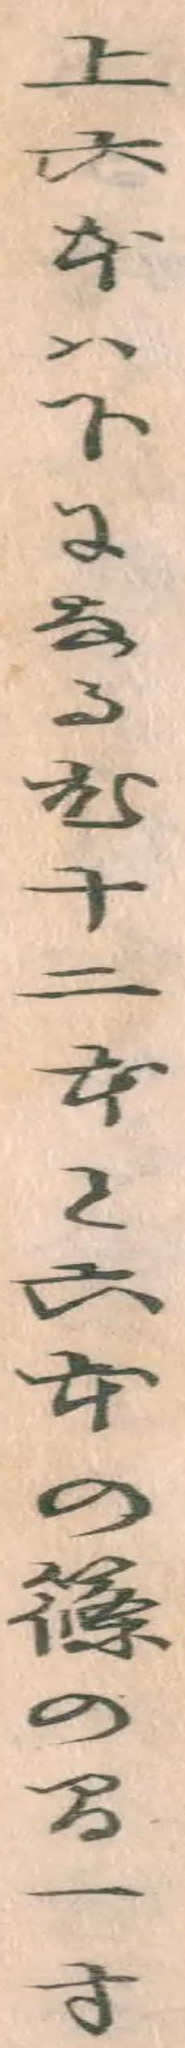上六本は下になる尤十二本と六本の篠の間一寸
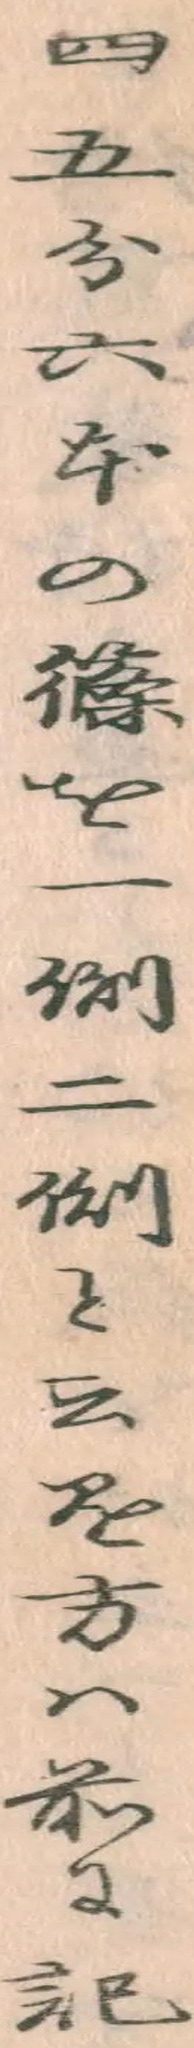四五分六本の篠を一側二側と云懸方は前に記
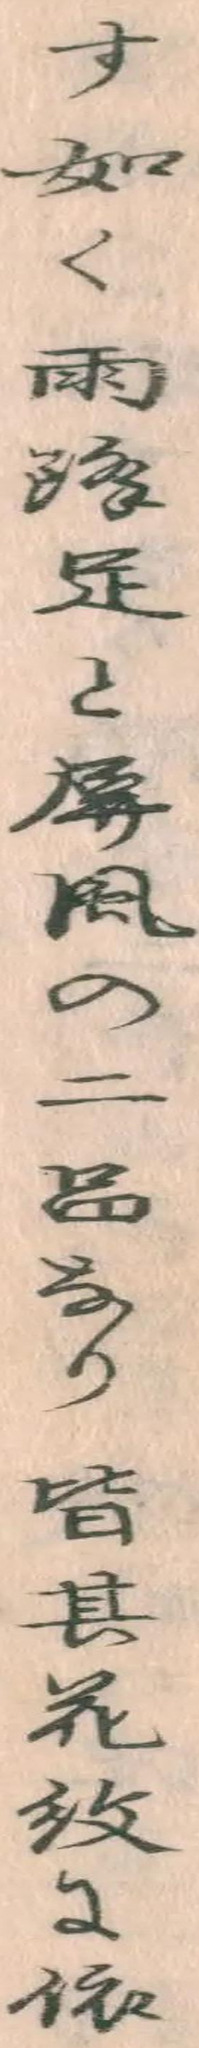す如く雨降足と屏風の二品なり皆其花紋に依
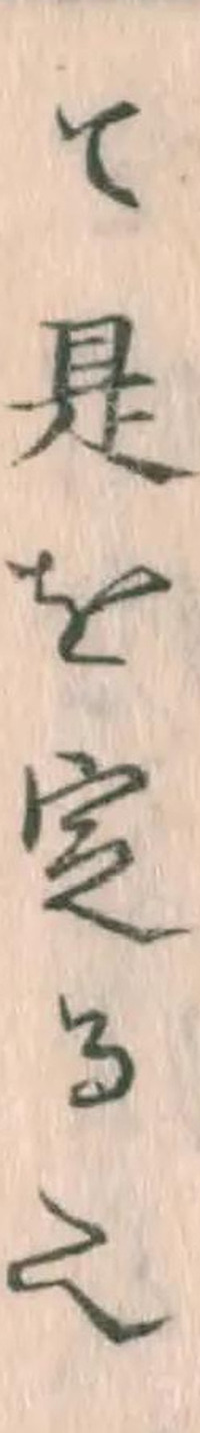て是を定る也
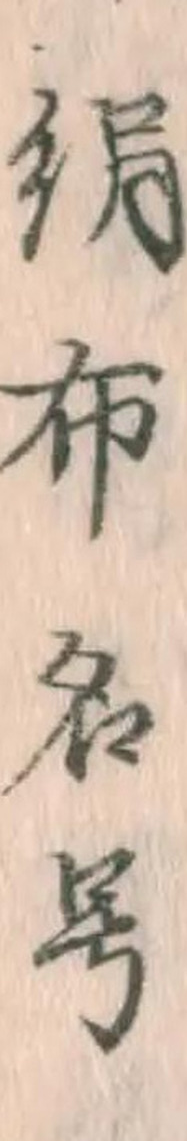絹布名号
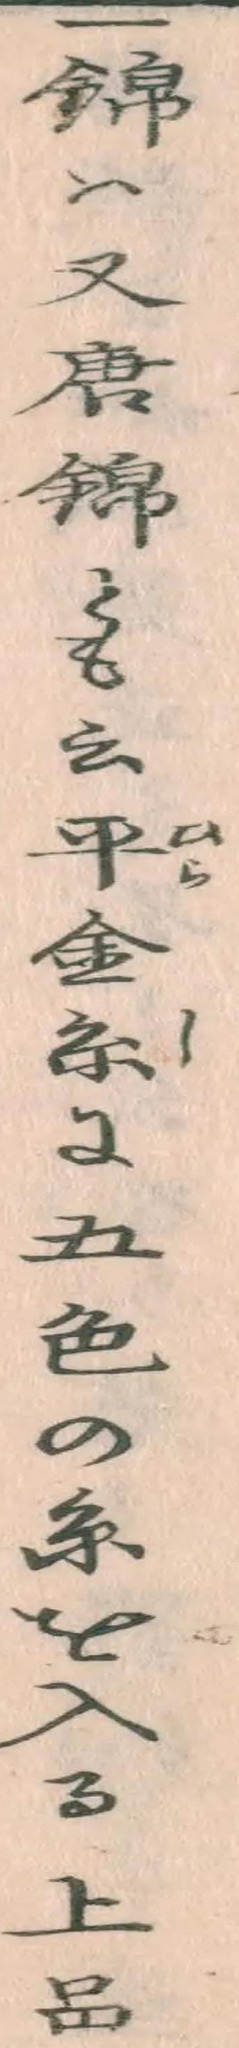一錦は又唐錦とも云平金糸に五色の糸を入る上品
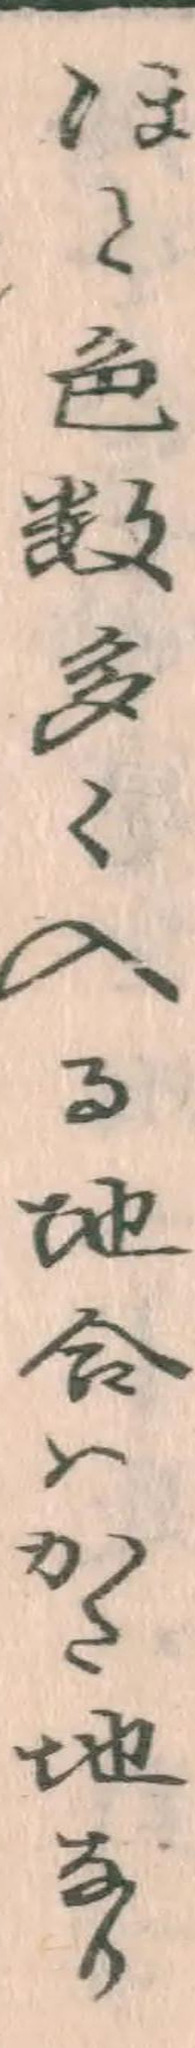ほと色数多く入る地合はかた地なり
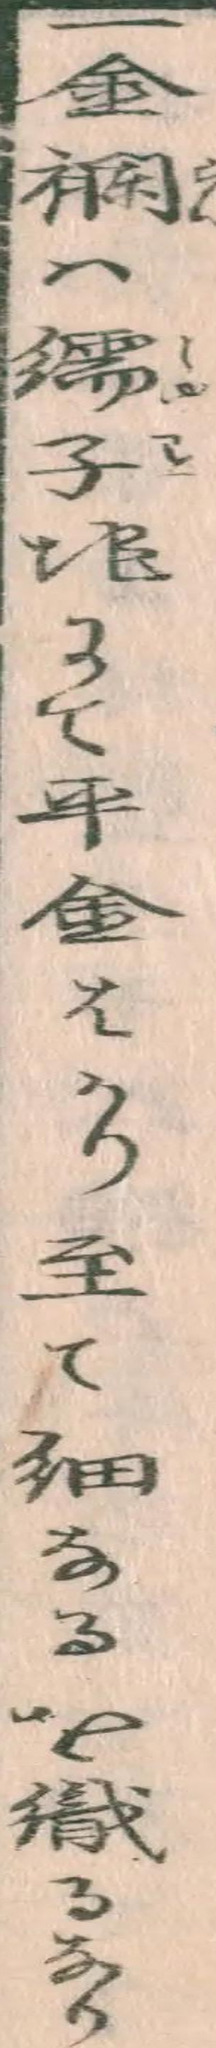一金襴は繻子地にて平金はかり至て細なるを織るなり
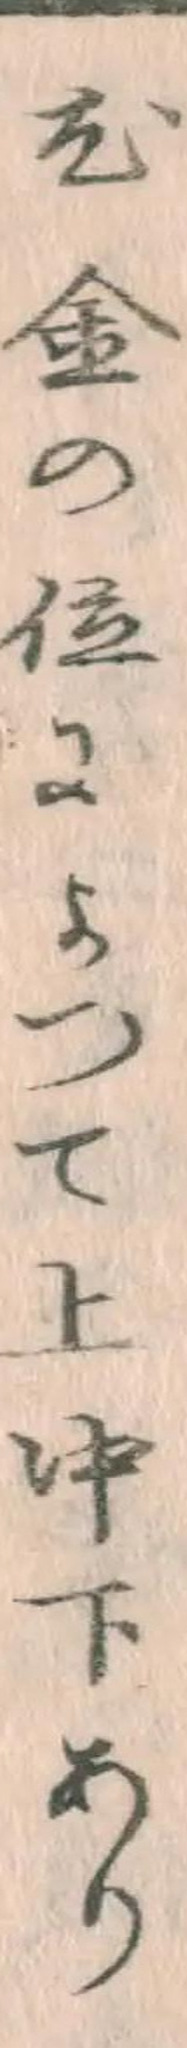尤金の位によつて上中下あり
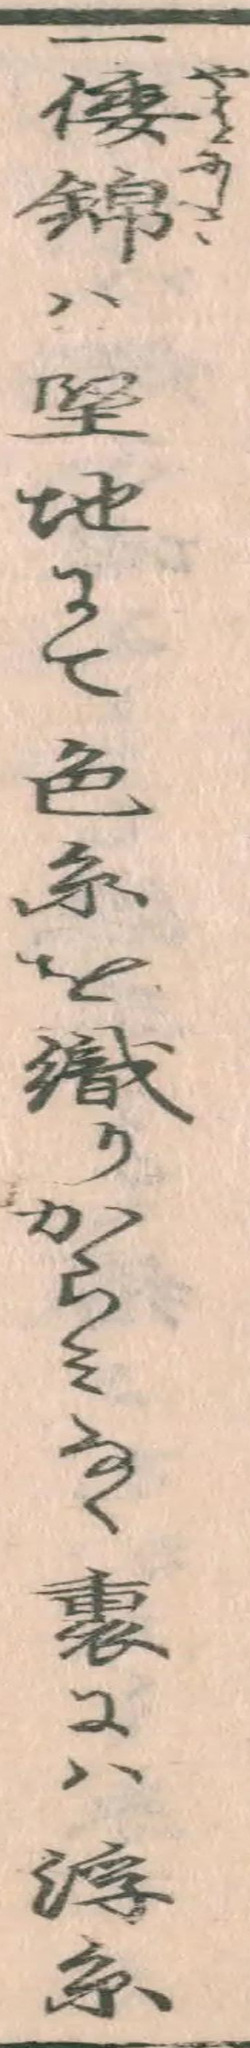一倭錦は堅地にて色糸を織りからみなく裏には浮糸
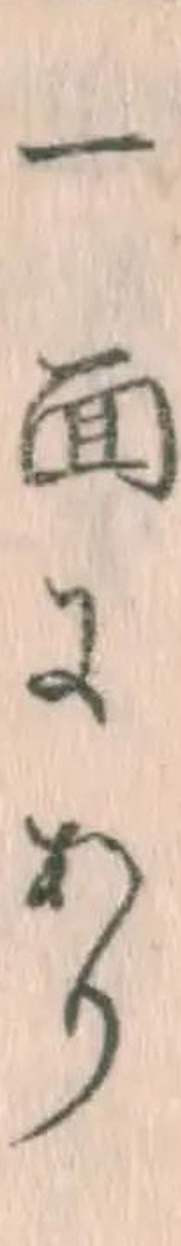一面にあり
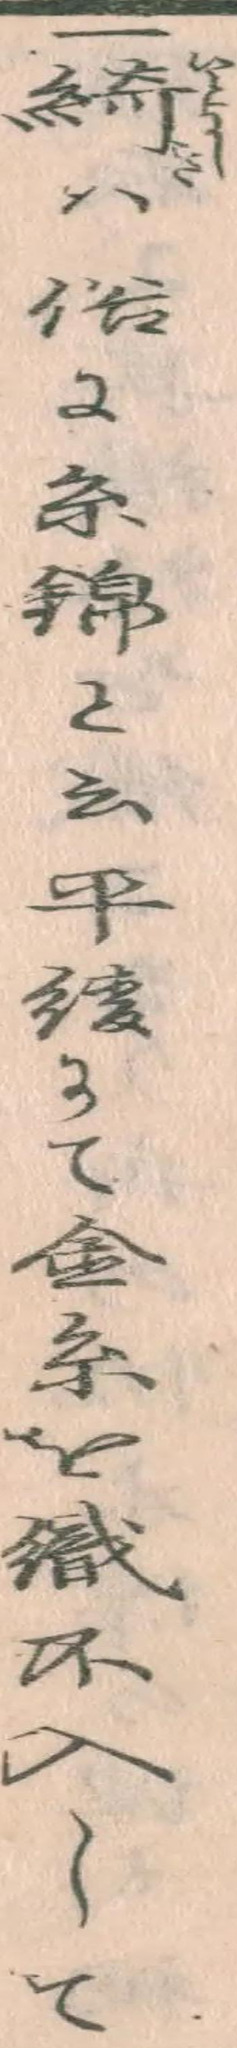一綺は俗に糸錦と云平綾にて金糸を織不入して
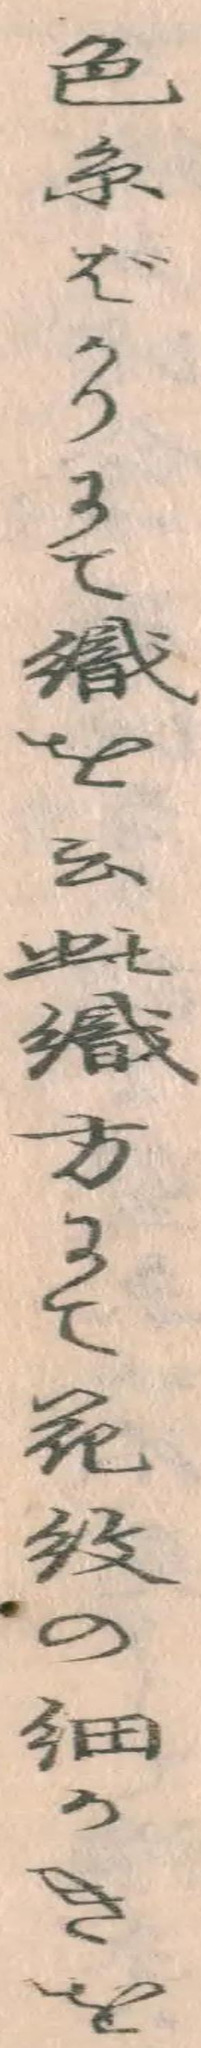色糸ばかりにて織を云此織方にて花紋の細かきを
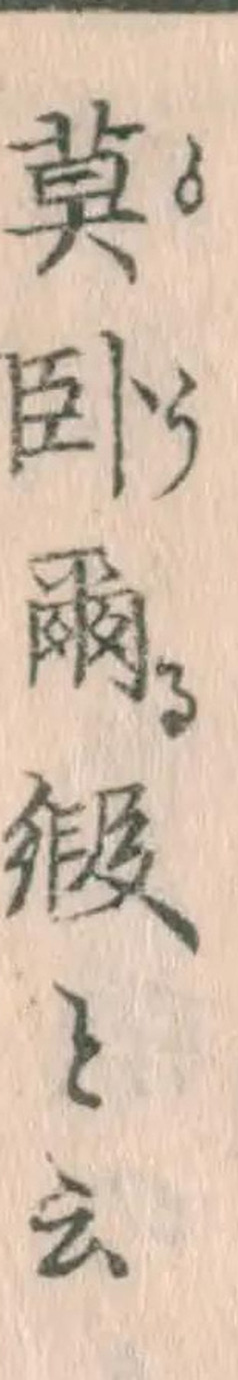莫臥爾緞と云
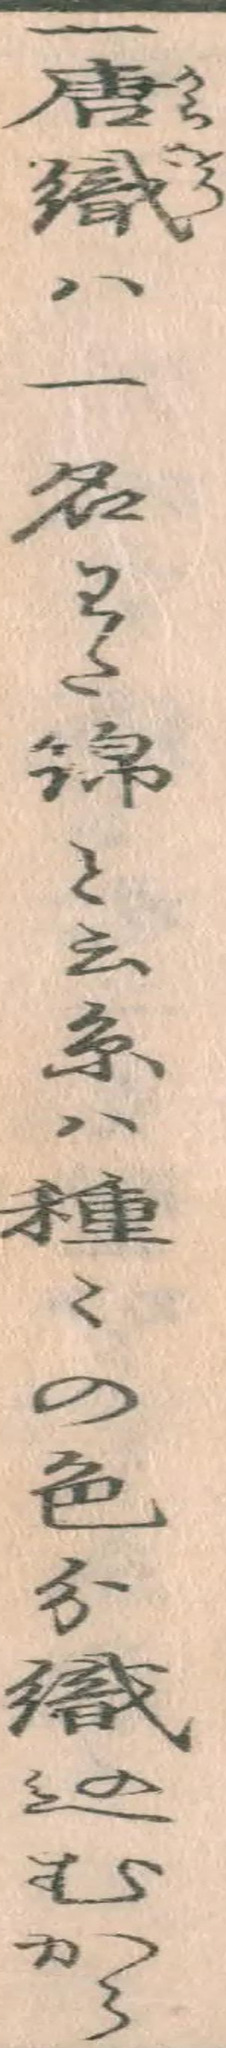一唐織は一名わた錦と云糸は種々の色分織込むから
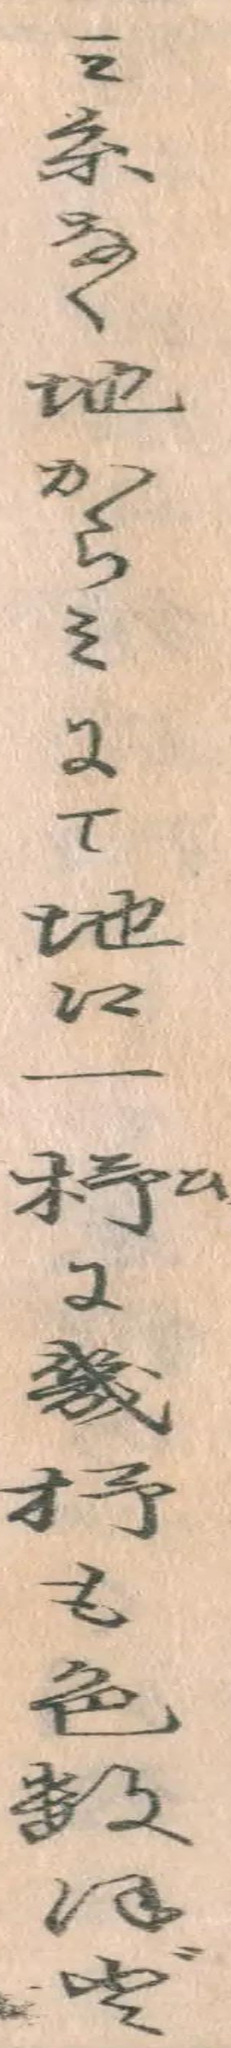み糸なく地からみにて地口一杼に幾杼も色数ほど
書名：機織彙編 5巻. [2]
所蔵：国立国会図書館 National Diet Library, JAPAN
